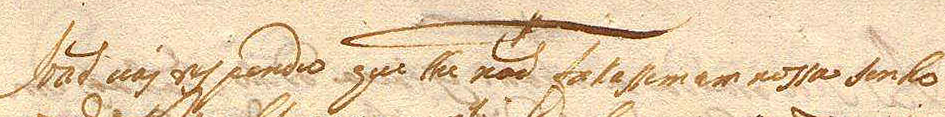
Joaõ uas respondeo que lhe naõ falassem em nossa senho
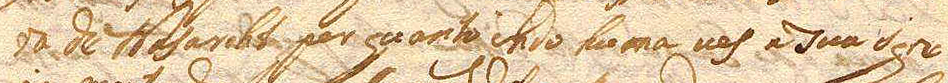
ra de Nasareht porquanto indo huma ues a sua Igre
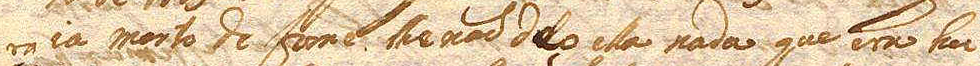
ia morto de fome lhe naõ deo ella nada que era hu
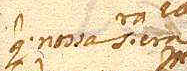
q̄ nossa s.ra era
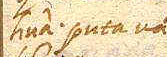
huā puta ua
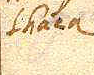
lhaca
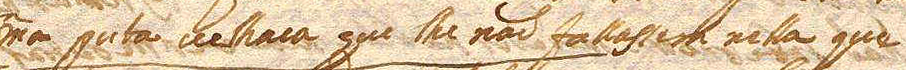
ma puta uelhaca que lhe naõ fallassem nella que
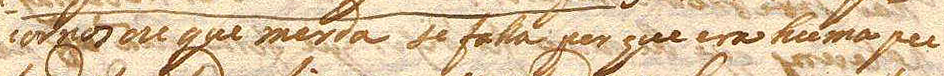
cornos ou que merda se falla porque era huma pu
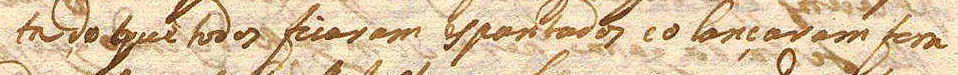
ta, do que todos ficaram espantados e o lançaram fora
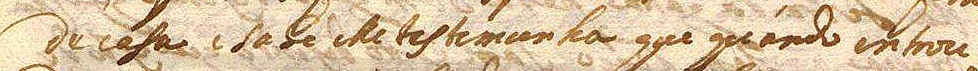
de casa e sabe elle testemunha que quando entrou
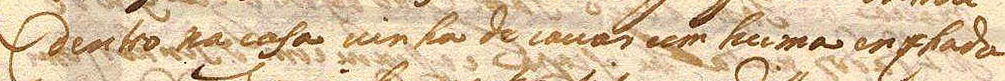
dentro na casa uinha de cauar com huma enxhada
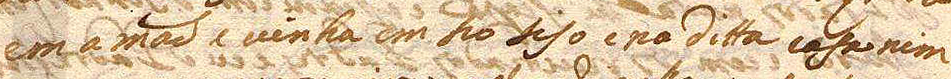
em a maõ e uinha em seo siso, e na ditta casa nim
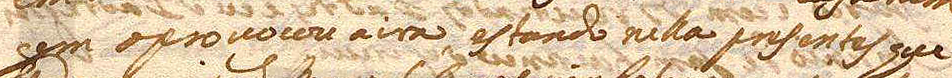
gem o prouocou a ira, estando nella presentes que
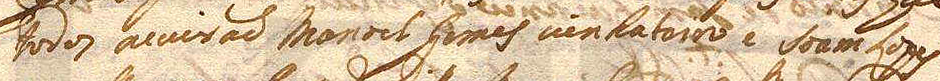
todos ouuiraõ Manoel Gomes uinhateiro e Ioam Lopes
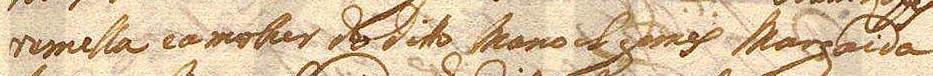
remella e a molher do ditto Manoel gomes Margaida
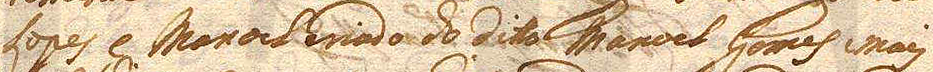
Lopes, e Manoel criado do ditto Manoel Gomes e mais
